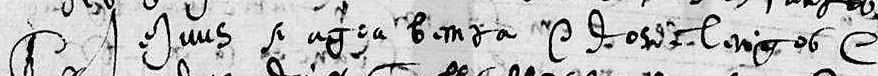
e JeJuus e agoa bemta e dos clerigos e
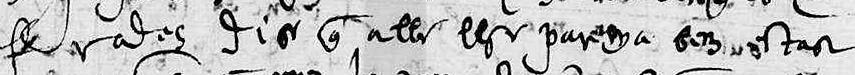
frades dise q̄ a elle lhe parecya bem estar
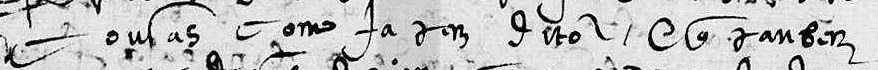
Cousas como Ja tem ditō / e q̄ tanbem
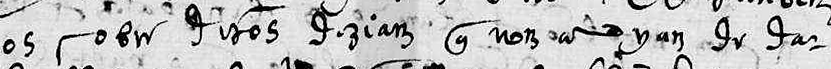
os sobreditōs deziam q̄ nom avyam de dar
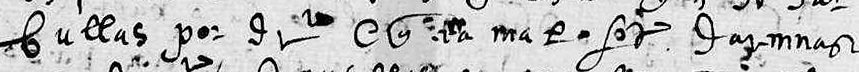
bullas por drro e q̅ era mal fto darem nas
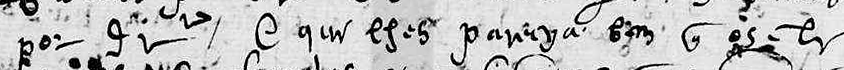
por drro / e que lhes parecya bem q̄ os cle
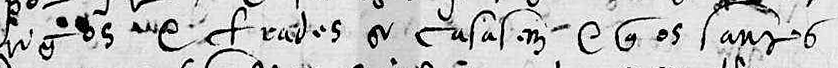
rigos e frades se casasem e q̄ os santos
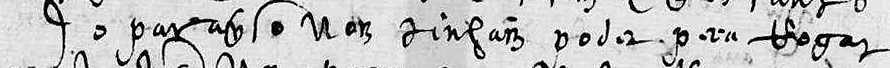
do parayso nom tinham poder pera Rogar
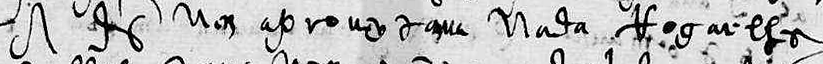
A ds̄ nem aproueytaua nada Rogarlhes
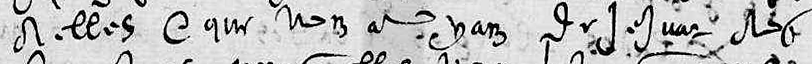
A elles e que nom avyam de JeJuar Aos
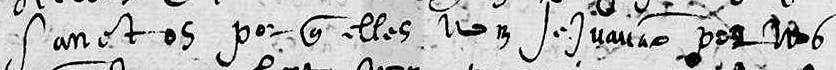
Sanctos porq̅ elles nom JeJuauão por nos
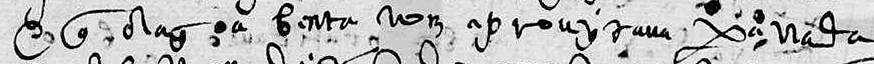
e q̅ A agoa benta nom aproueytaua ꝑa nada
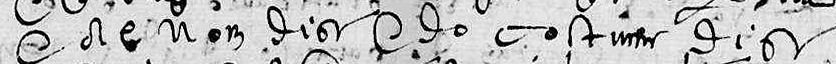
e Al nom dise e do costume dise
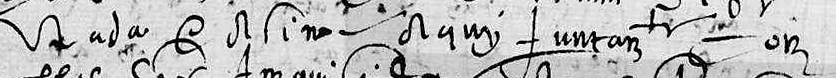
Nada e Asinou Aquy Juntamte Com
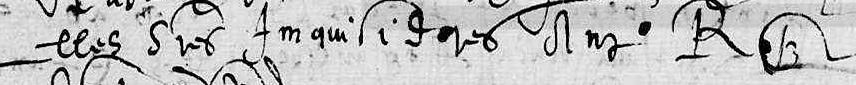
elles Srēs Jmquisidores Anto Rojz̄
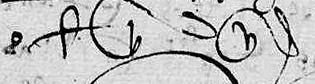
o stp̄vy
